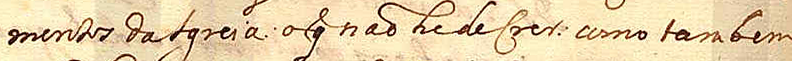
mentos da Igreia: o q̄ naõ he de Crer: como tambem
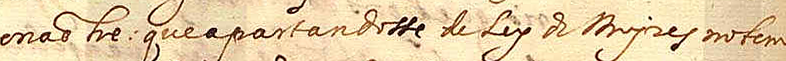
o naõ he: que apartandosse de Ley de Mojzes no tem
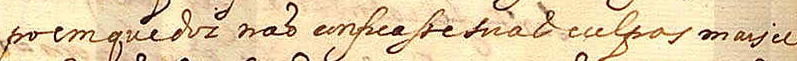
po em que diz naõ confecasse suas culpas mais ce
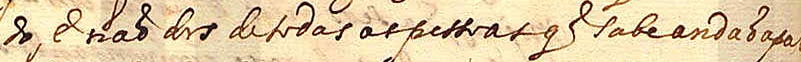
do, E naõ dis de todas as pessoas q̄ sabe andaõ apar
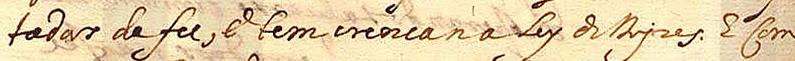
tadas da fee, E tem crenca na Ley de Mojzes. E Com
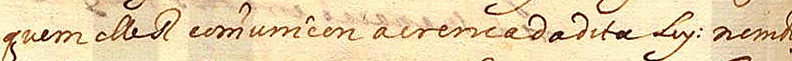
quem elle R com̄unicou a crenca da dita Ley: nem dis
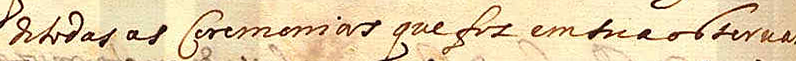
de todas as Ceremonias que fez em sua obseruan
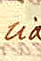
cia
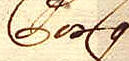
Por q̄
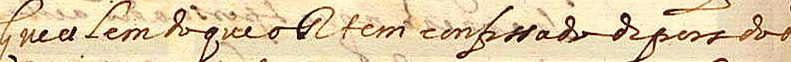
Que aLem do que o R tem confessado depois do do
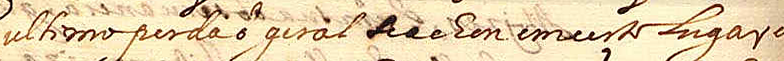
ultimo perdaõ geral se achou em certo Lugar em
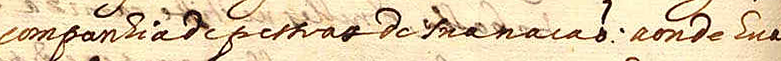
companhia de pessoas de sua nacaõ: aonde huā
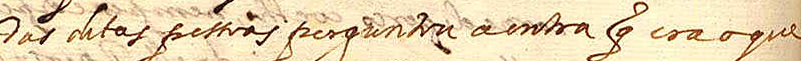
das ditas pessoas perguntou a outra q̄ era o que
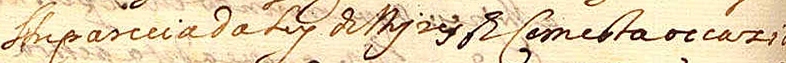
Lhe parecia da Ley de Mojzes, E Com esta occazia
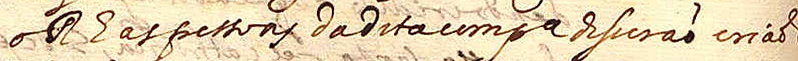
o R E as pessoas da dita compa disseraõ criaõ
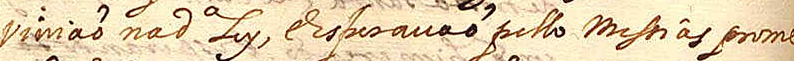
viviaõ na da Ley, E esperauaõ pello Messias prome
